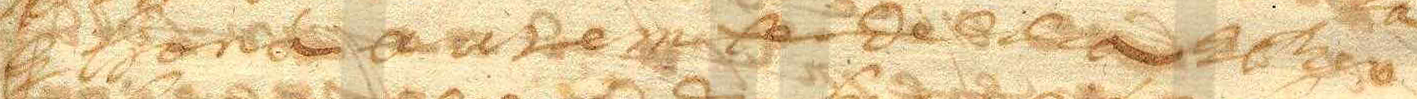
E hora auzemte della, E Reo
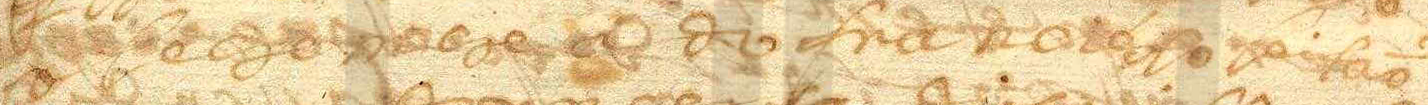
o lesemseado francisco leitaõ
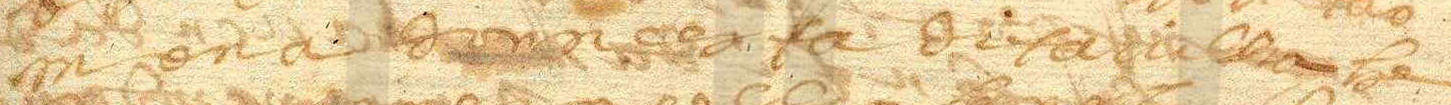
morador nesta dita uilla, he
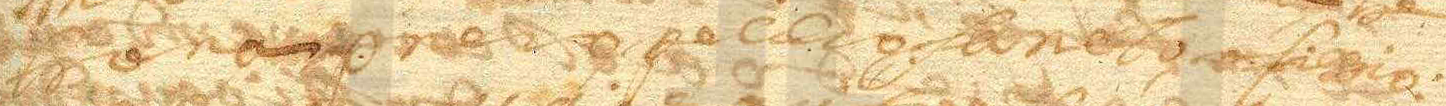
hora prezo pello sancto ofissio
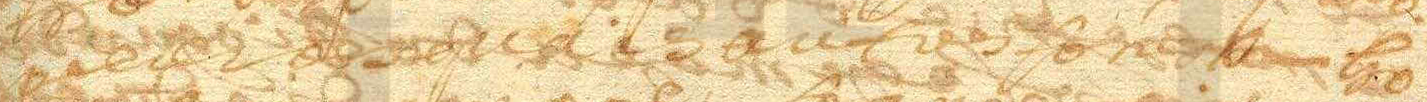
pellos quais autos Consta ho
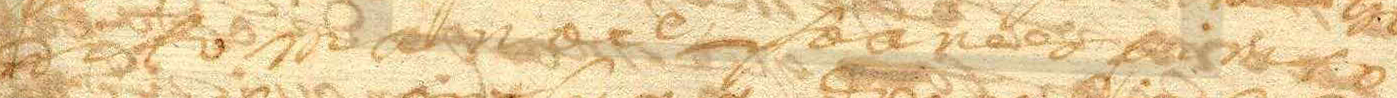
dito manoel soares pimto
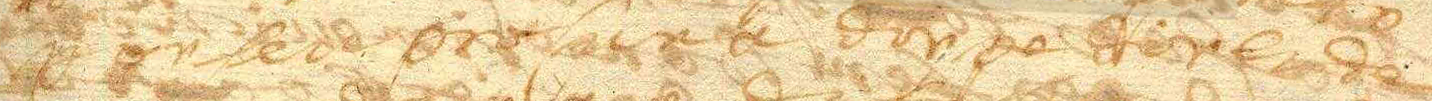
por seu proCurador pedir E de
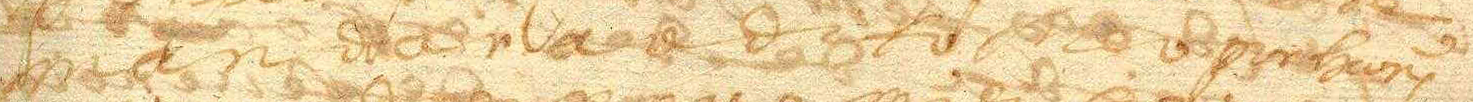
mandar ao dito Reo por huns̄
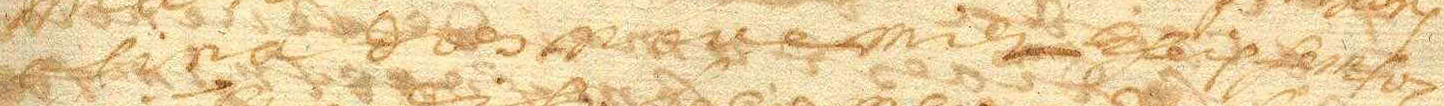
asinados noue mil E seiscemtos
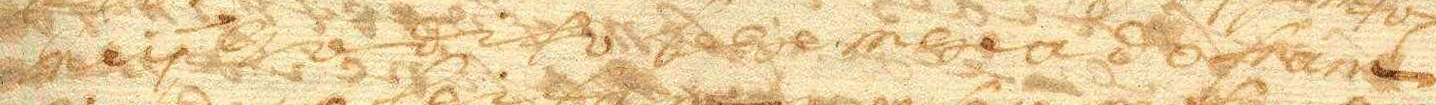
reis E o dito lesemseado fram
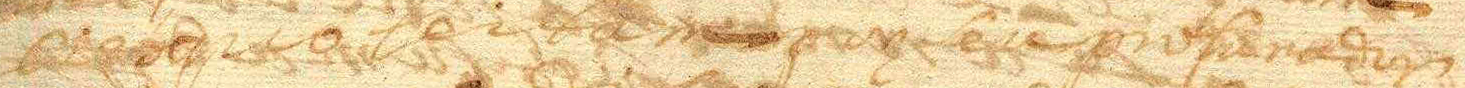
cisquo leitam por seu proCurador
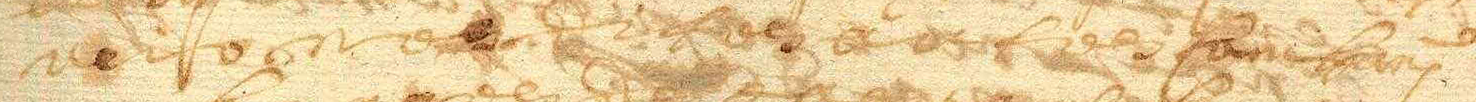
ueio nos ditos autos Com huns̄
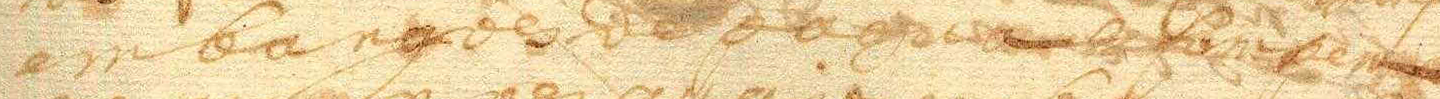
embargos de pagua E Compem
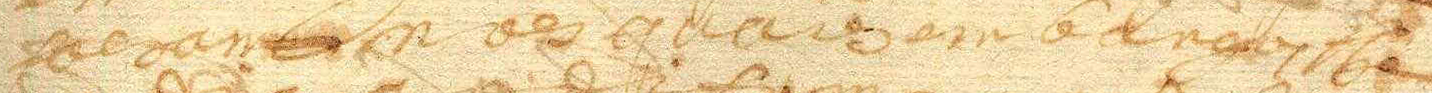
sasam nos quais embargos lhe
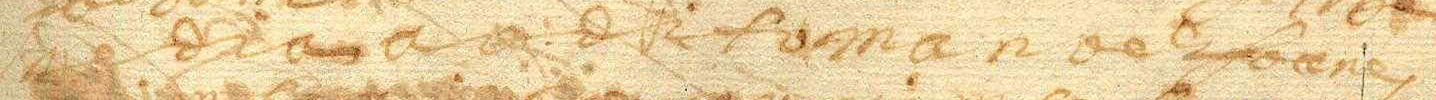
pedia ao dito manoel soares
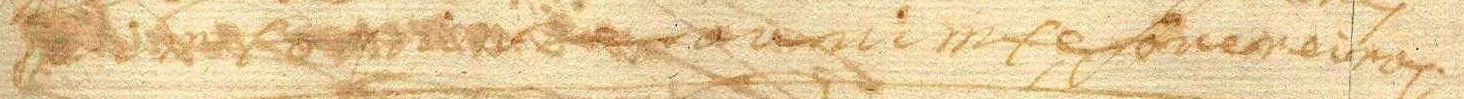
pimto quimze ou uimte souereiros
